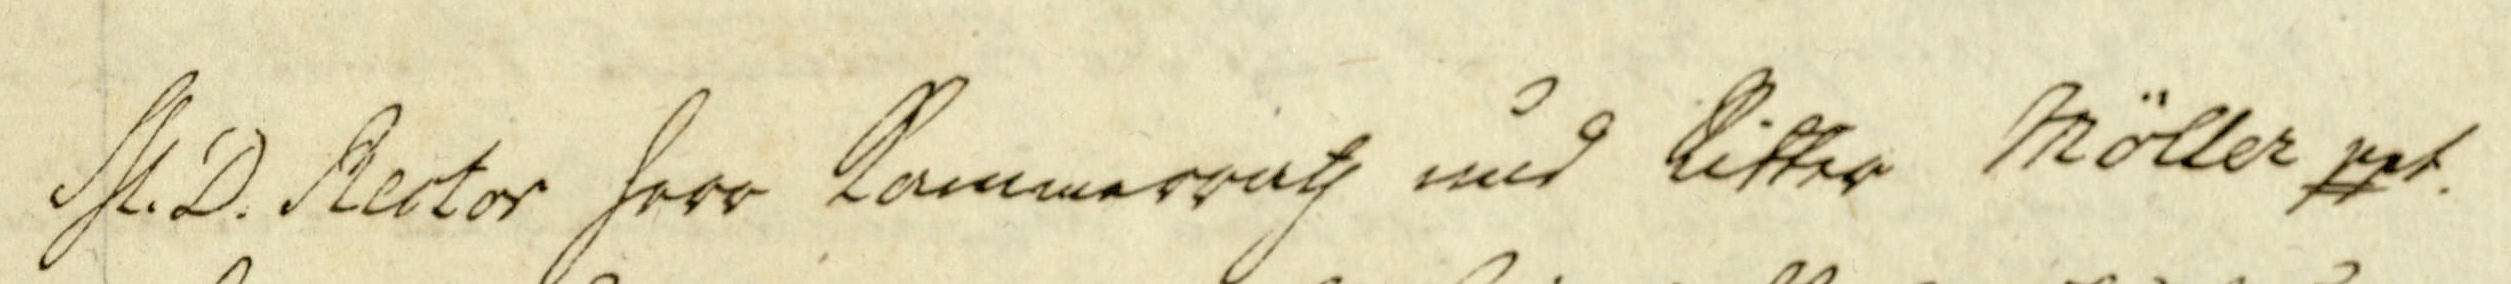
M. D. Rector herr Kammerrath und Ritter Möller ppt.
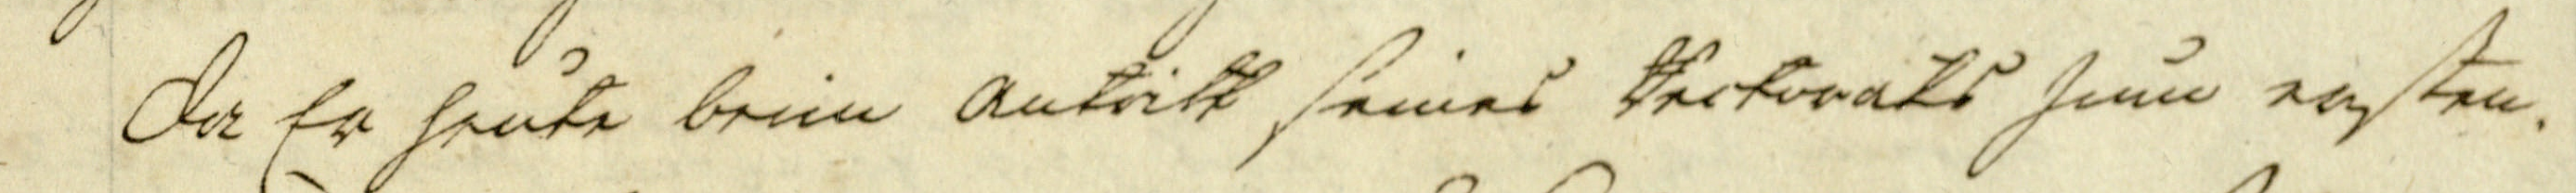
Da Er heute beim Antritt seines Rectorats zum ersten
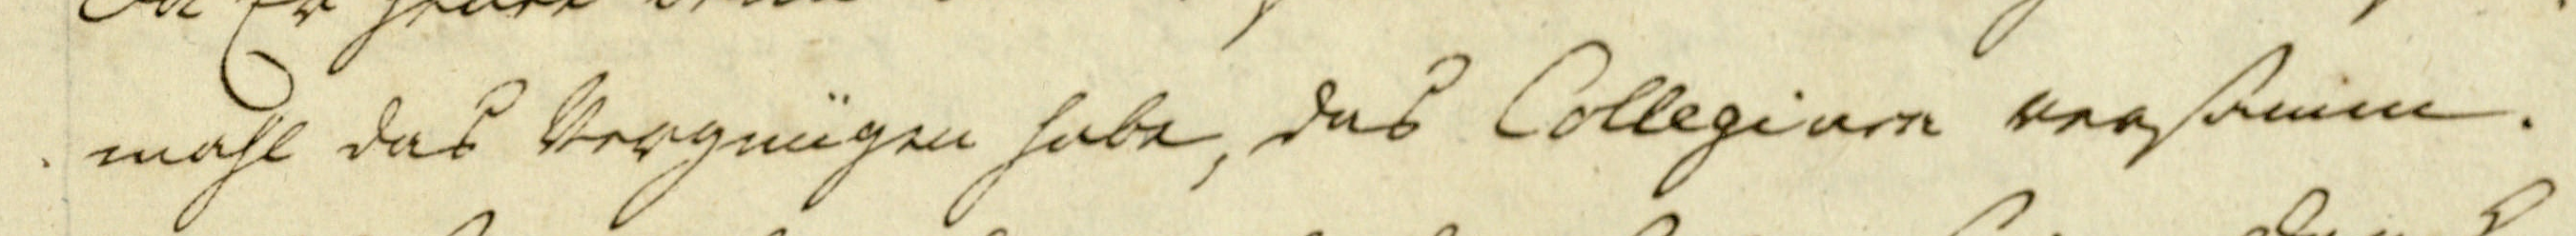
mahl das Vergnügen habe, das Collegium versamm¬
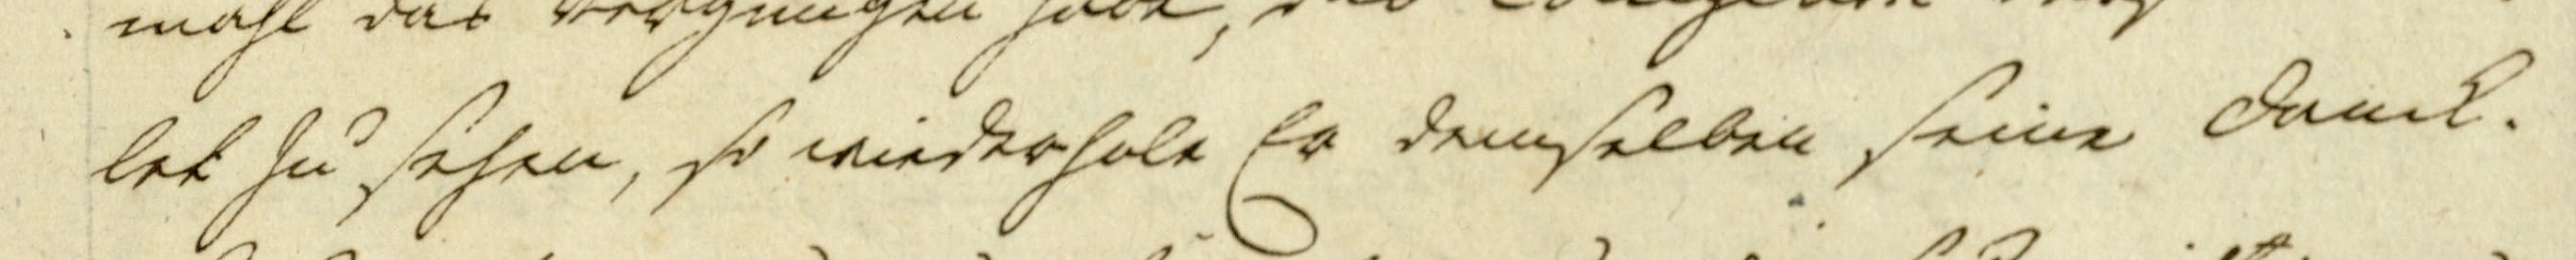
let zu sehen, so wiederhole Er demselben seine Danck¬
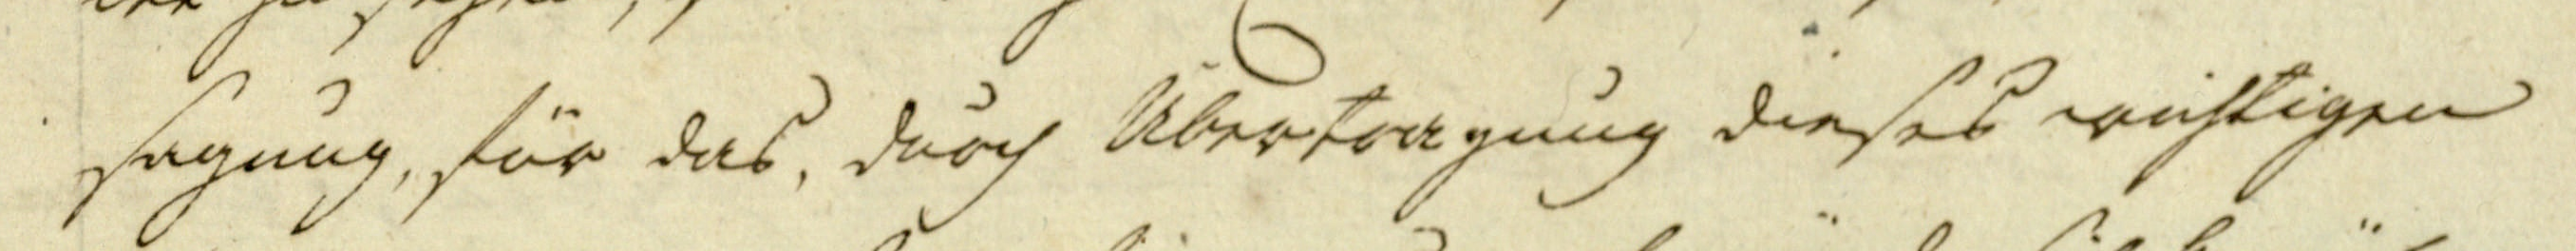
sagung, für das, durch Übertragung dieses wichtigen
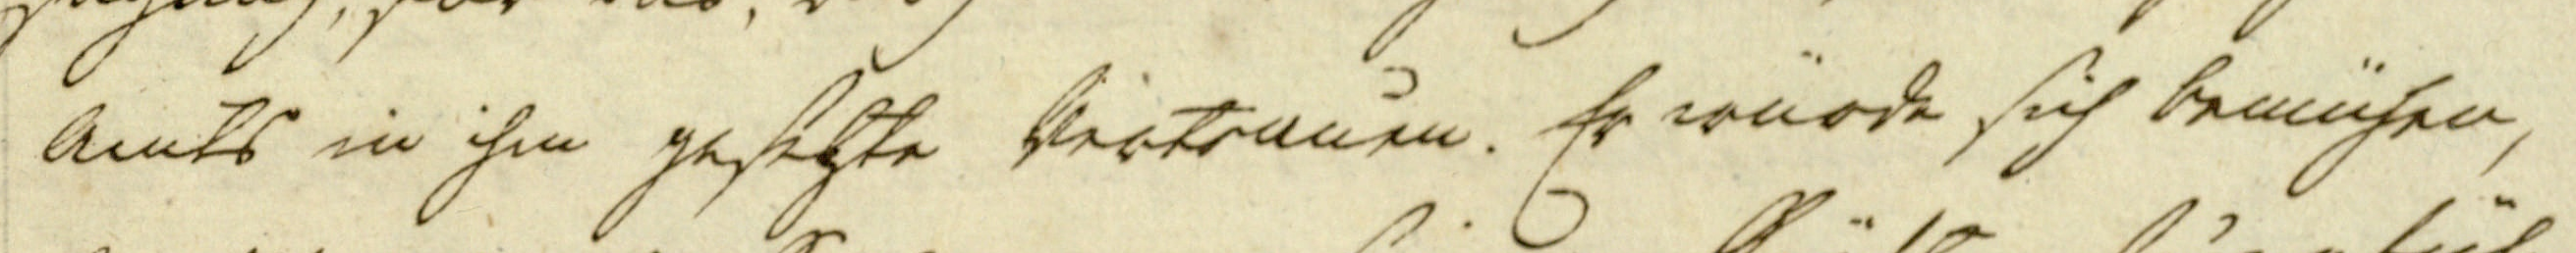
Amts in ihm gesetzte Vertrauen. Er würde sich bemühen,
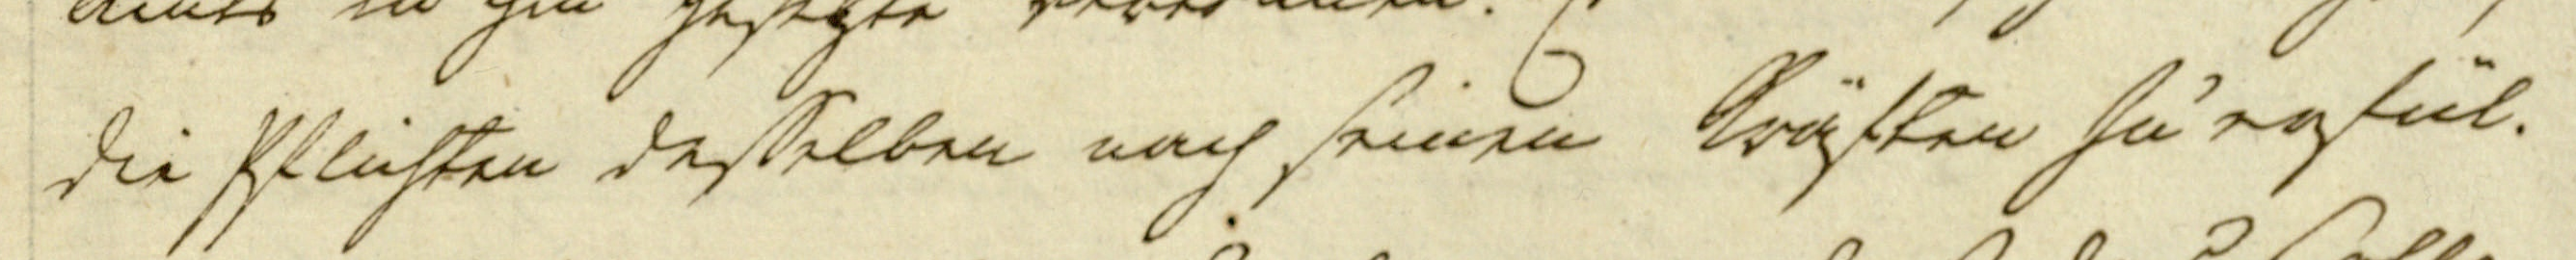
die Pflichten desselben nach seinen Kräften zu erfül¬
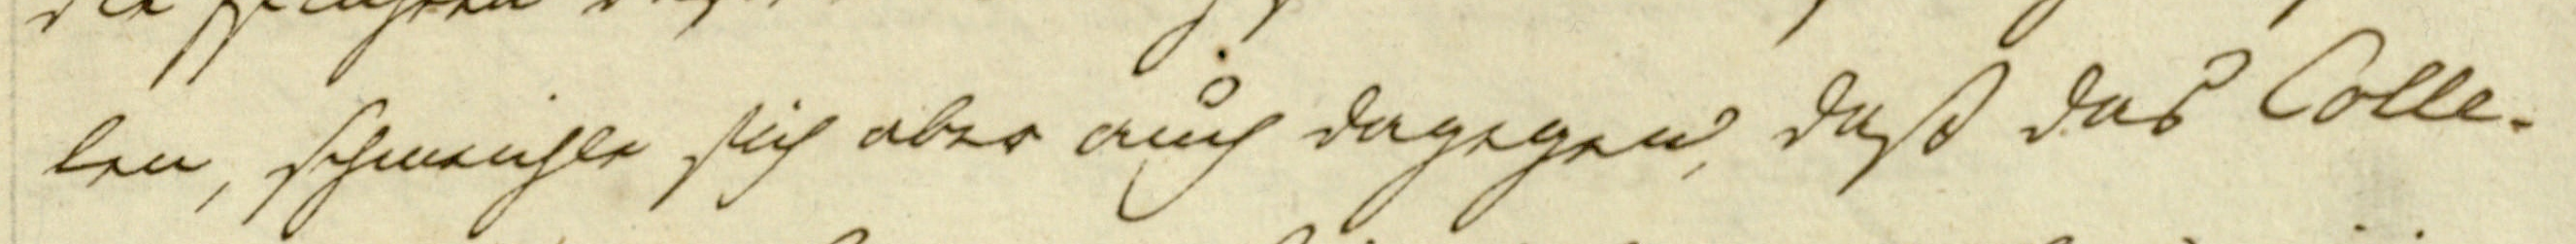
len, schmeichle sich aber auch dagegen, daß das Colle¬
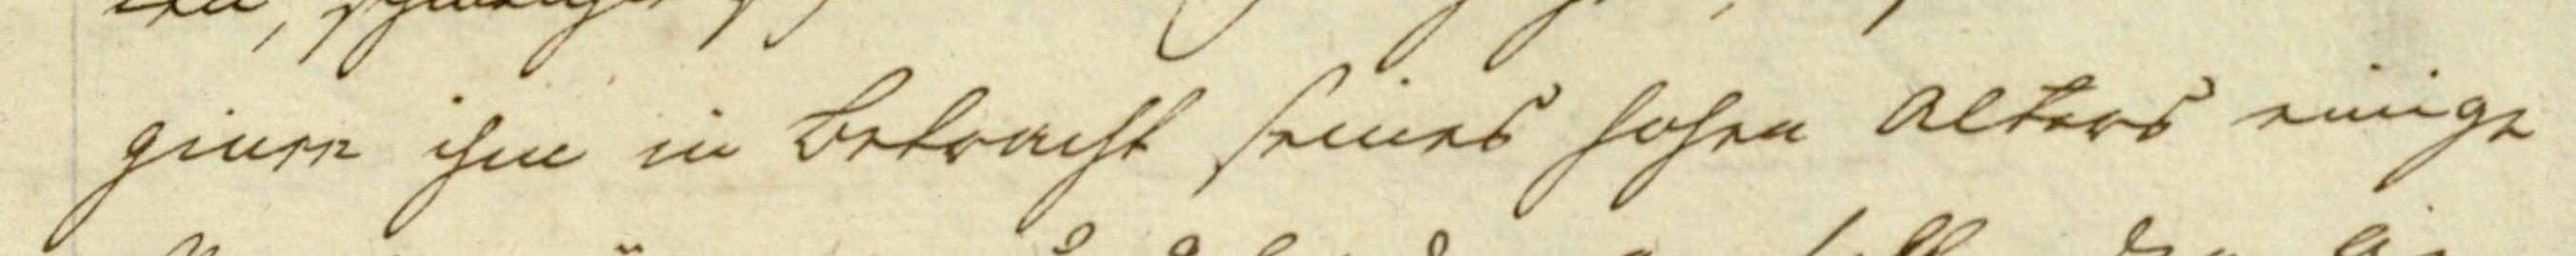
gium ihm in Betracht, seines hohen Alters einige
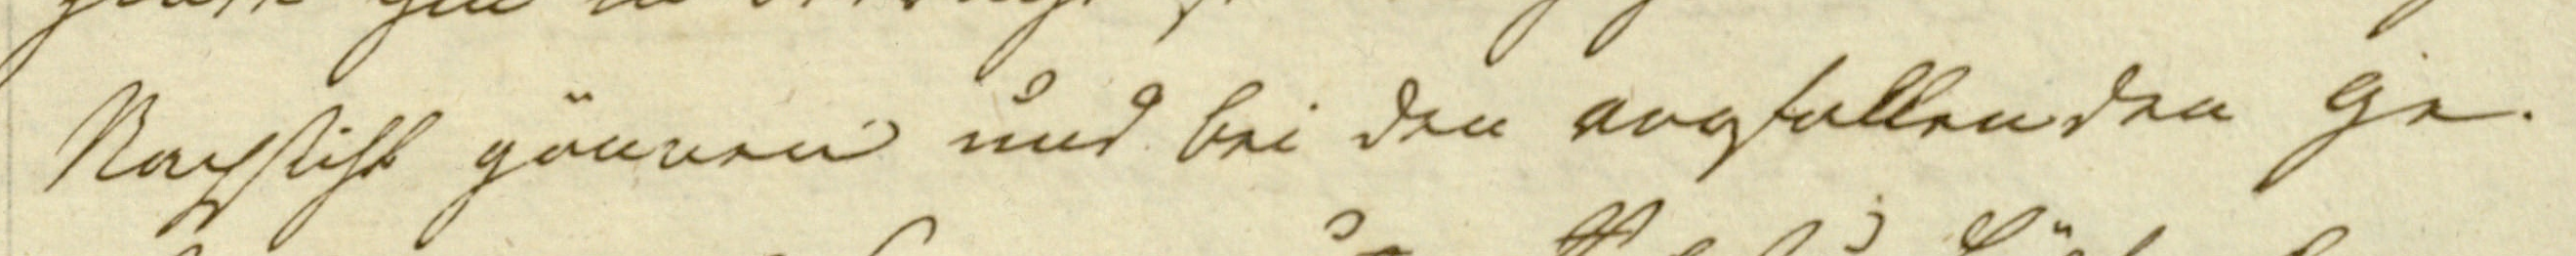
Nachsicht gönnen und bei den anfallenden Ge¬
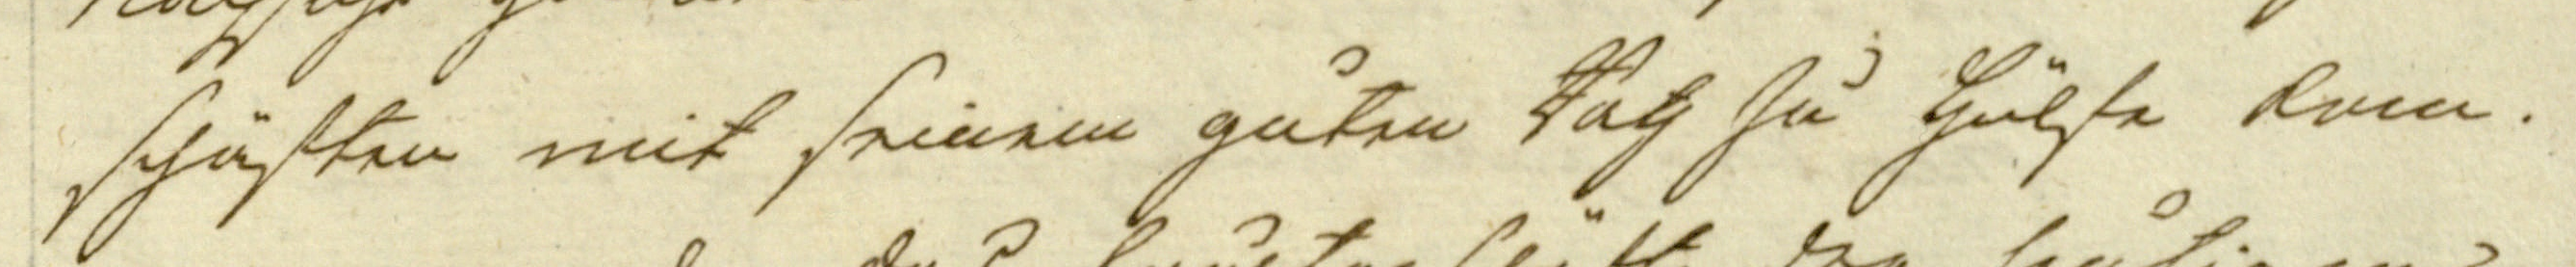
schäften mit seinem guten Rath zu Hülfe kom¬
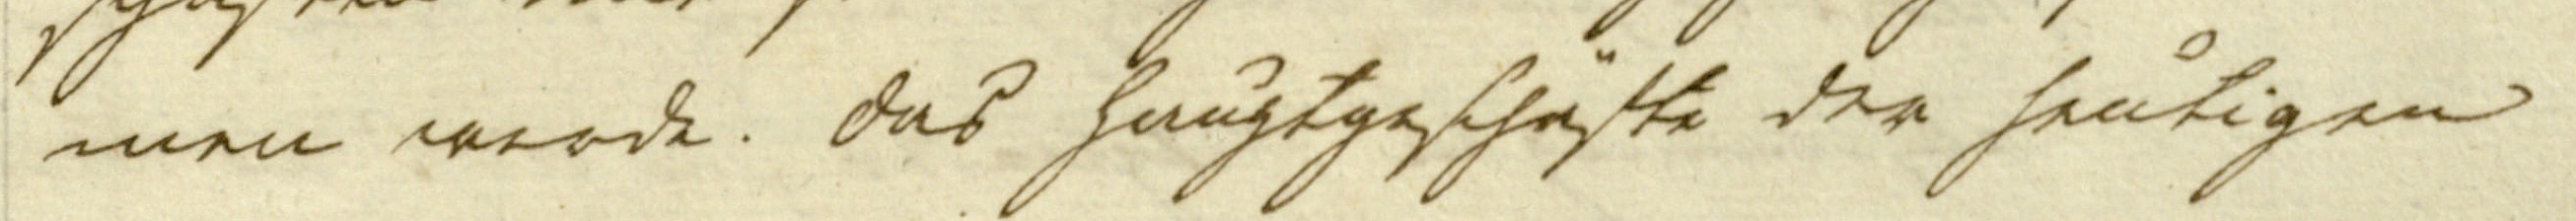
men werde. das Hauptgeschäfte der heutigen
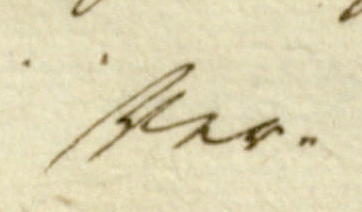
ver.
